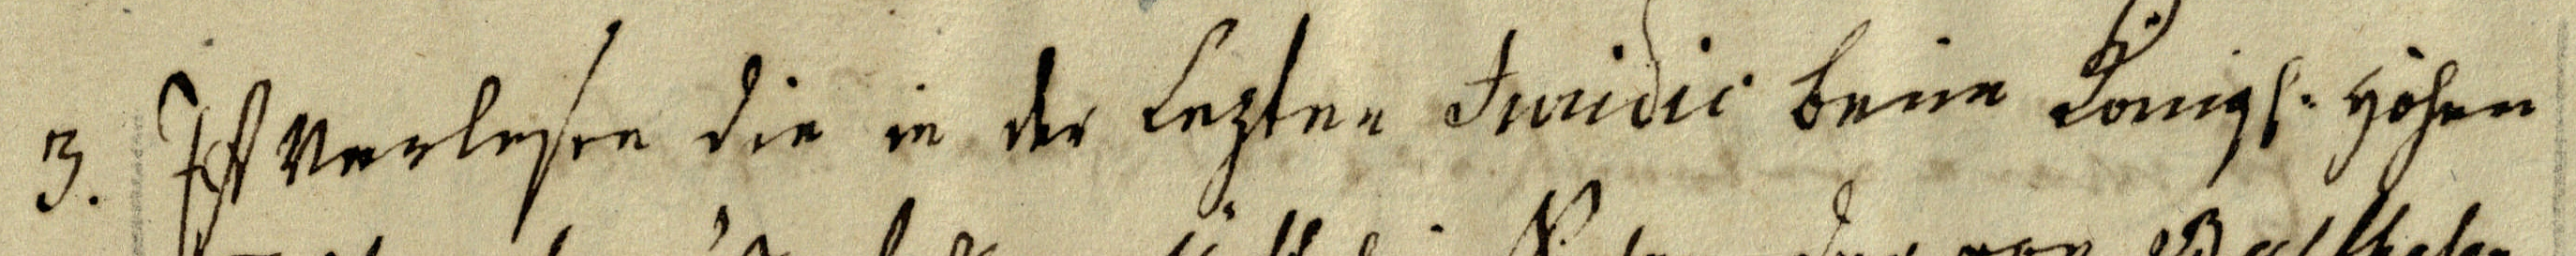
3. Ist verlesen die in der letzten Juridic beim Königl: Hohen
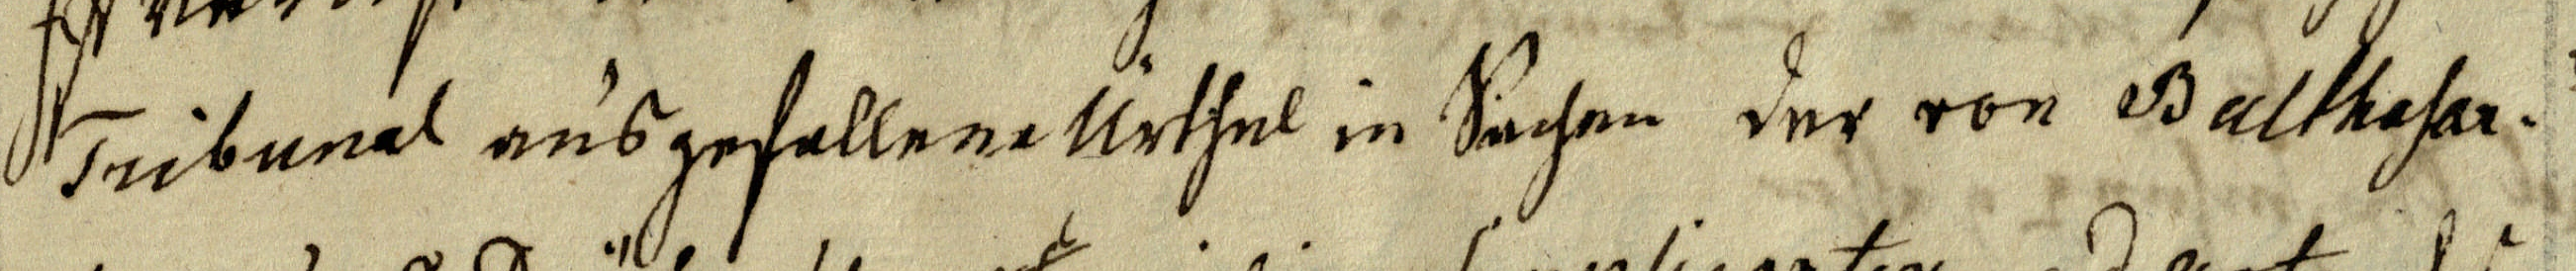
Tribunal ausgefallenen Urthel in Sachen der von Balthasar¬
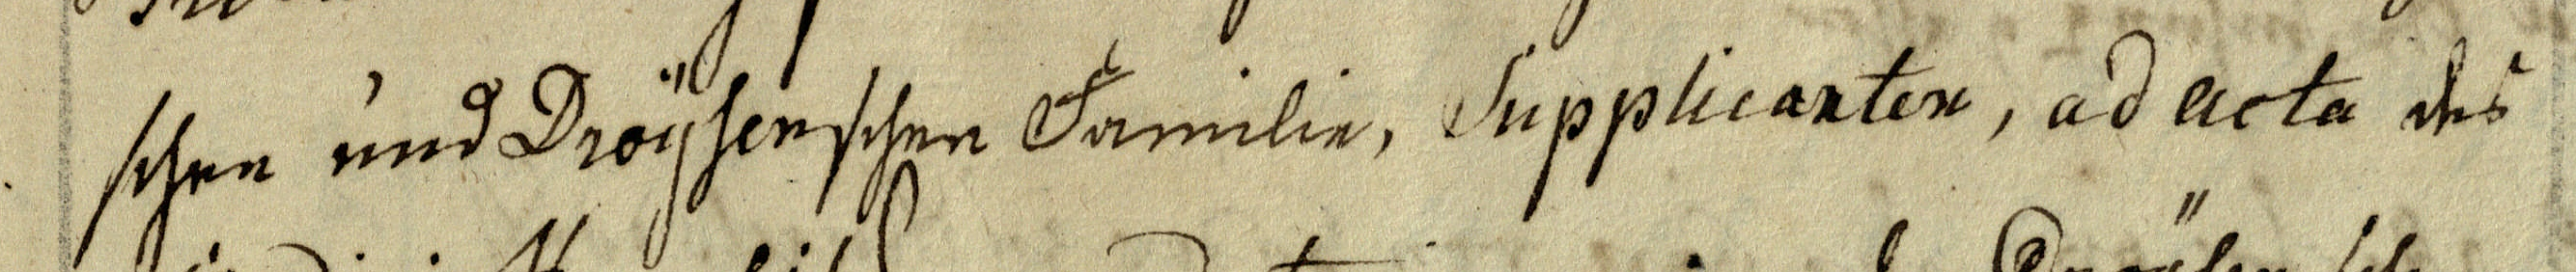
schen und Droÿsenschen Familie, Supplicanten, ad acta des
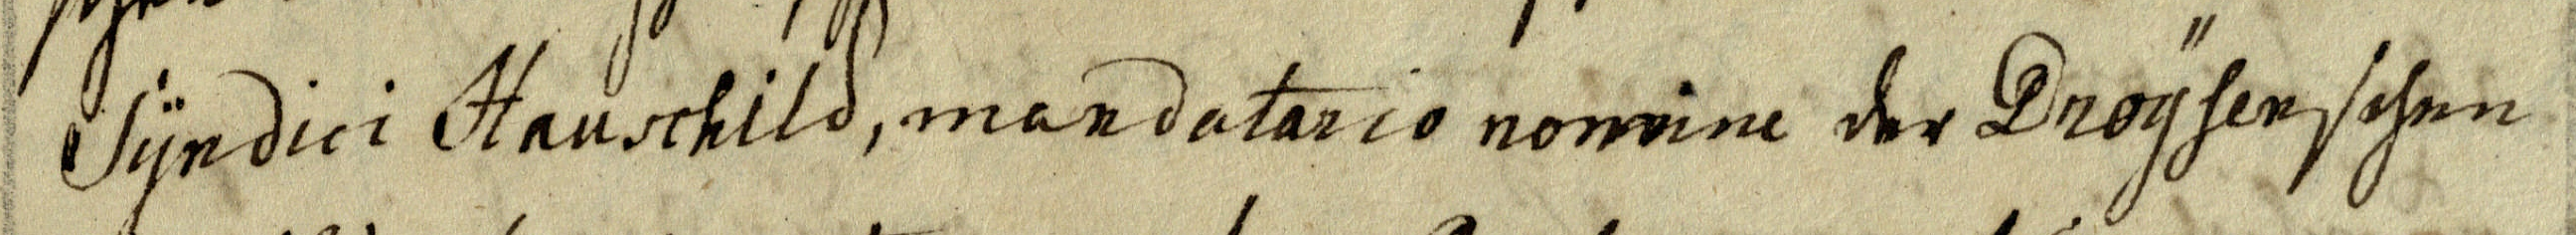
Sÿndici Hauschild, mandatario nomine der Droÿsenschen
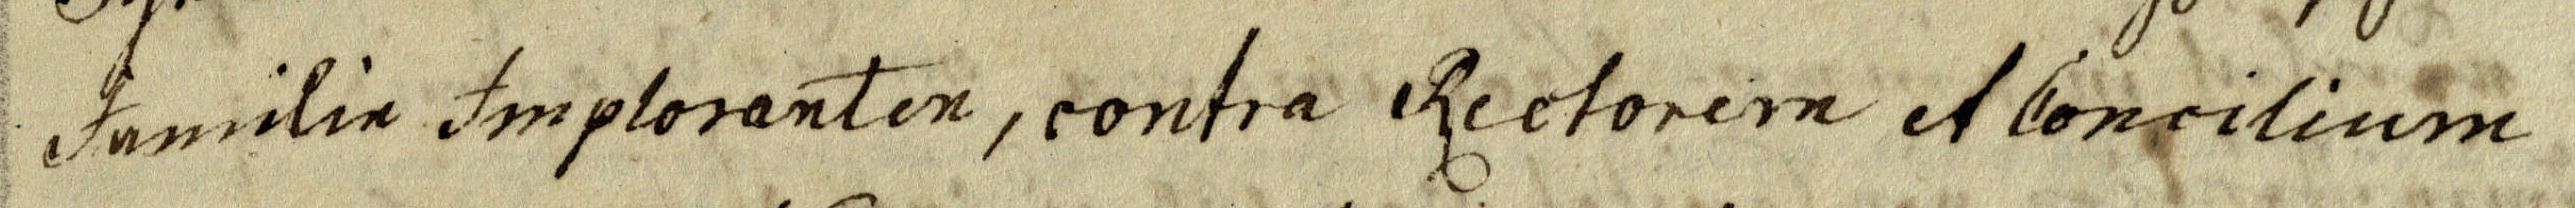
Familie Imploranten, contra Rectorem et Concilium
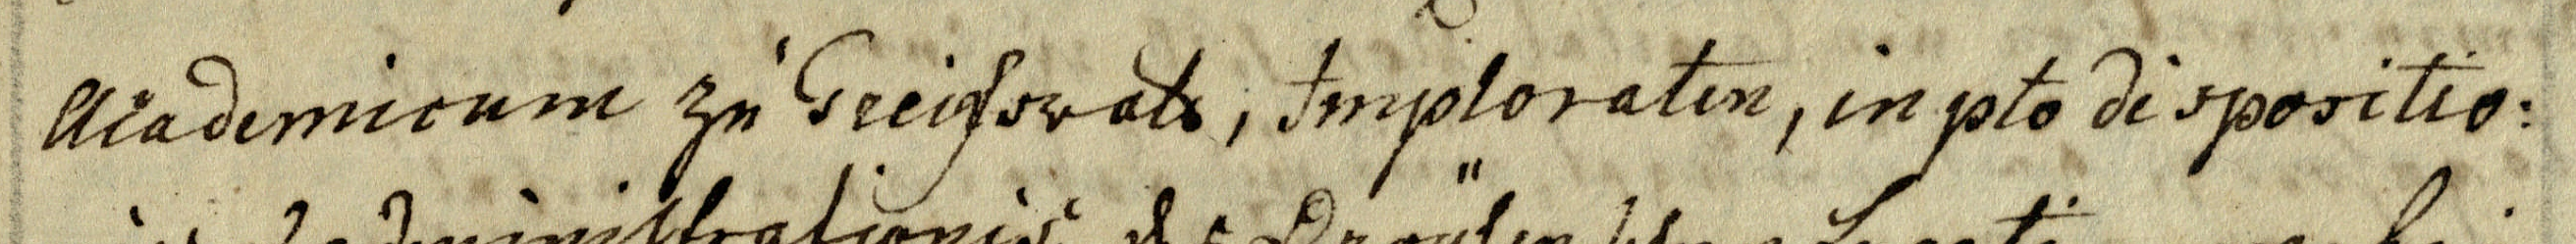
Academicum zu Greifswald, Imploraten, in pto dispositio¬
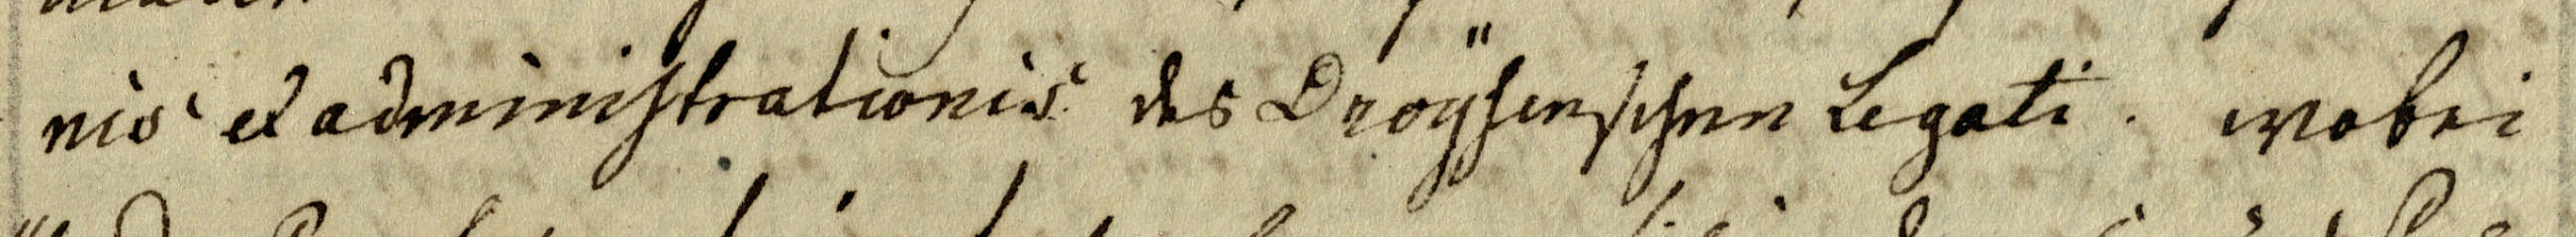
nis et administrationis des Droÿsenschen Legati. wobei
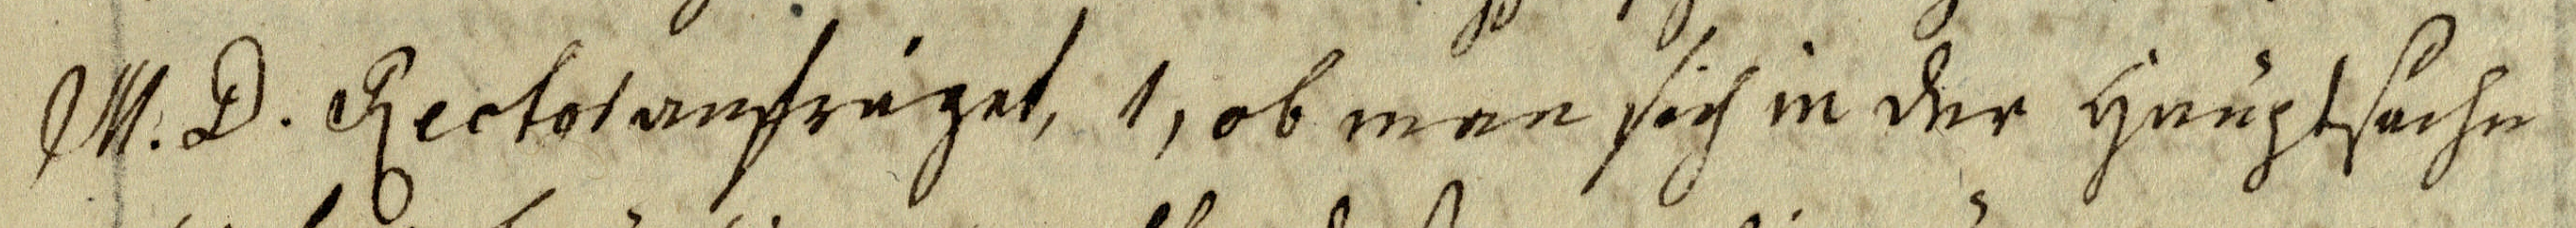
M. D. Rector anfräget, 1, ob man sich in der Hauptsache
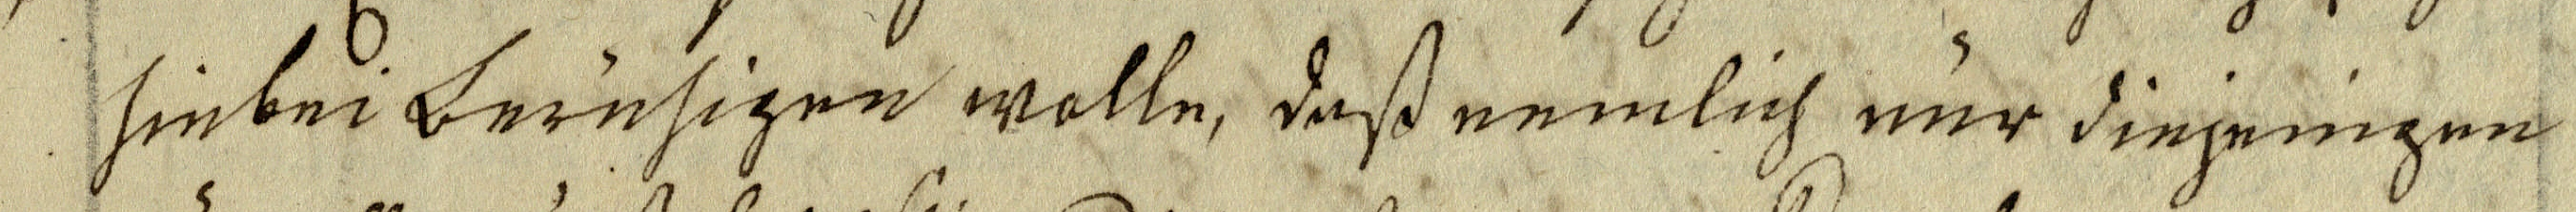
hiebei beruhigen wolle, daß nemlich nur diejenigen
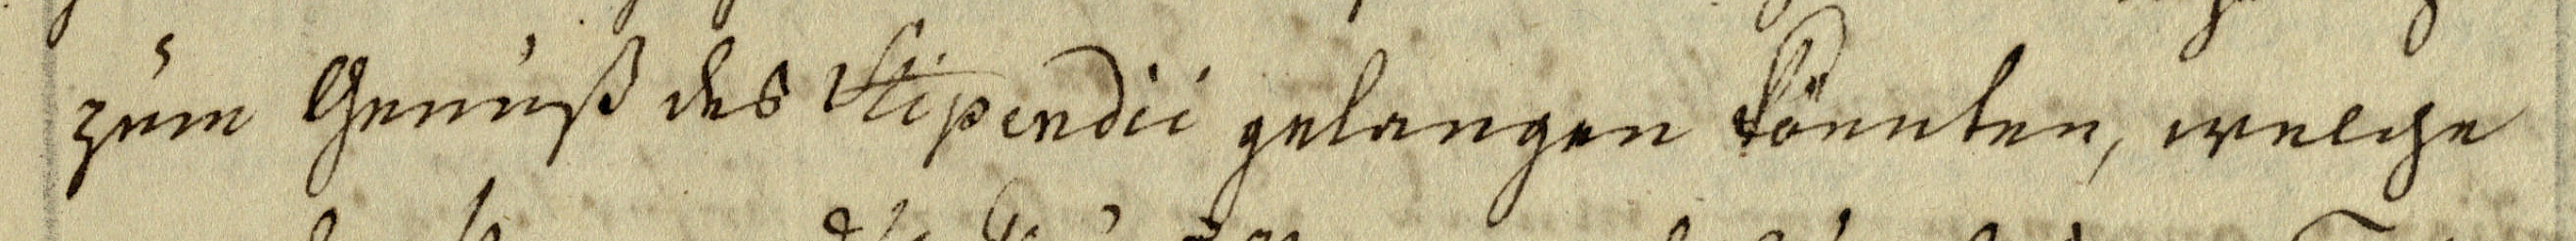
zum Genuß des Stipendii gelangen könnten, welche
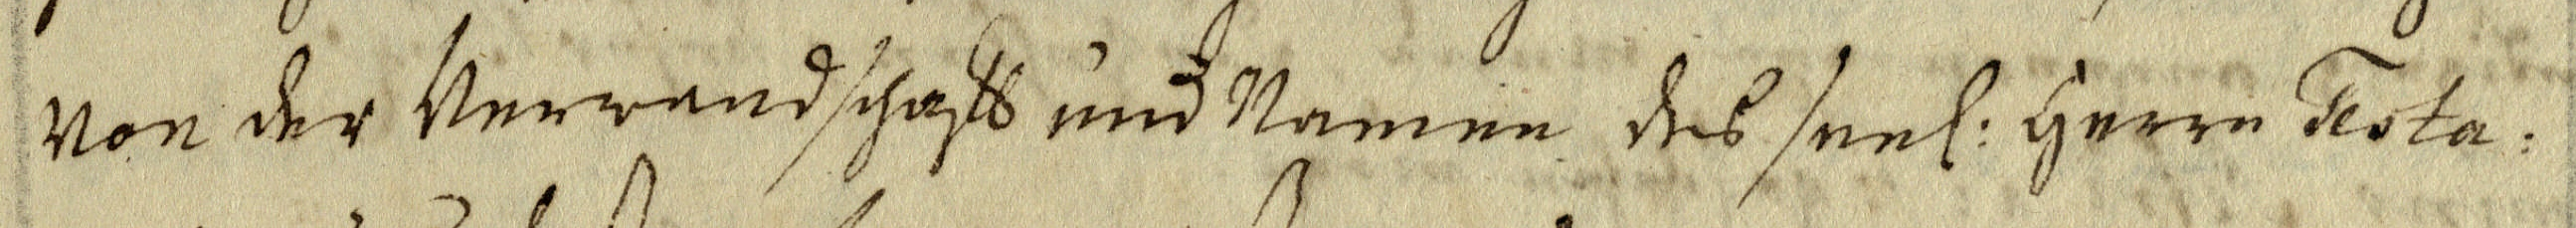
von der Verwandschaft und Namen des seel: Herrn Testa¬
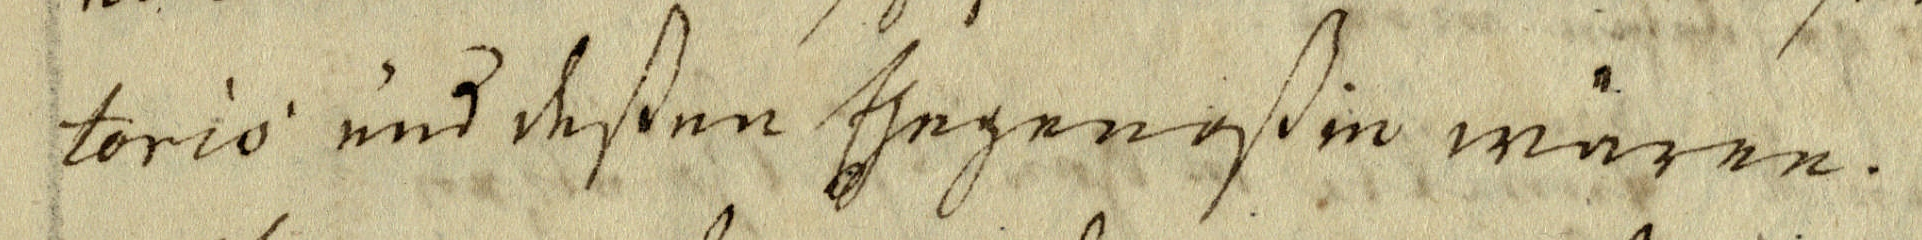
toris und deßen Ehegenoßin wären.
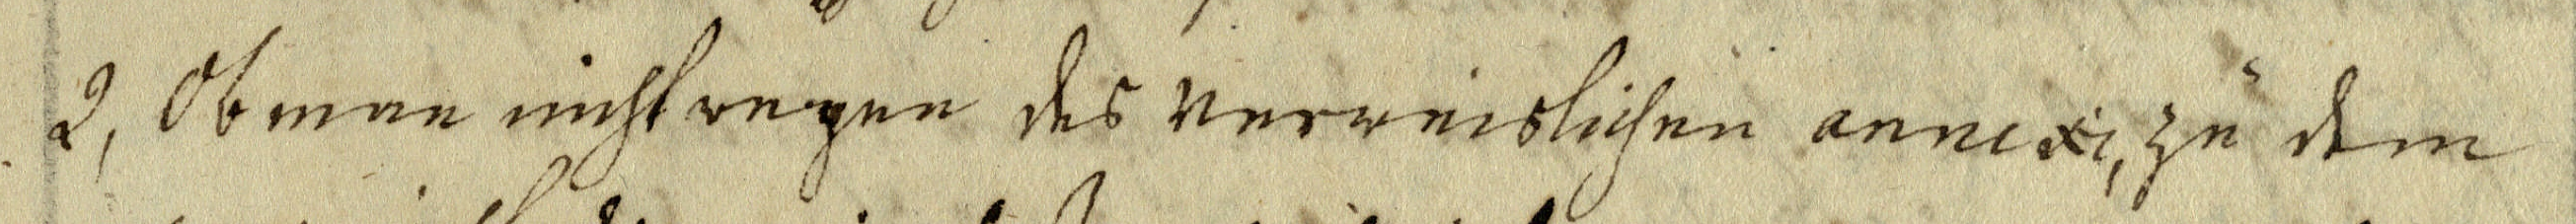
2, ob man nicht wegen des verweislichen annexi, zu dem
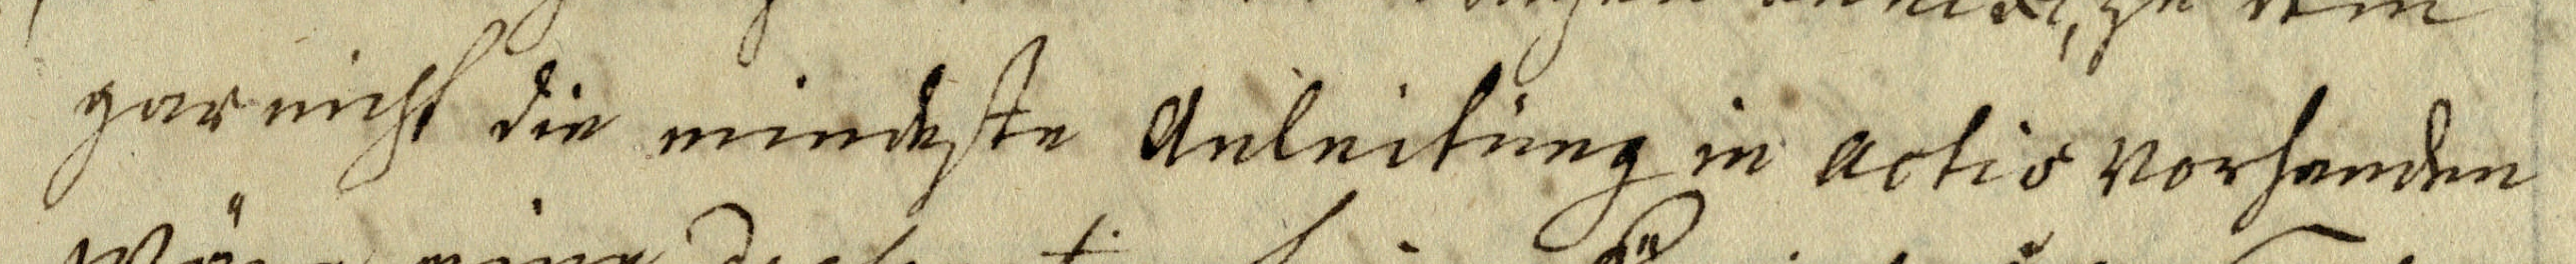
gar nicht die mindeste Anleitung in actis vorhanden
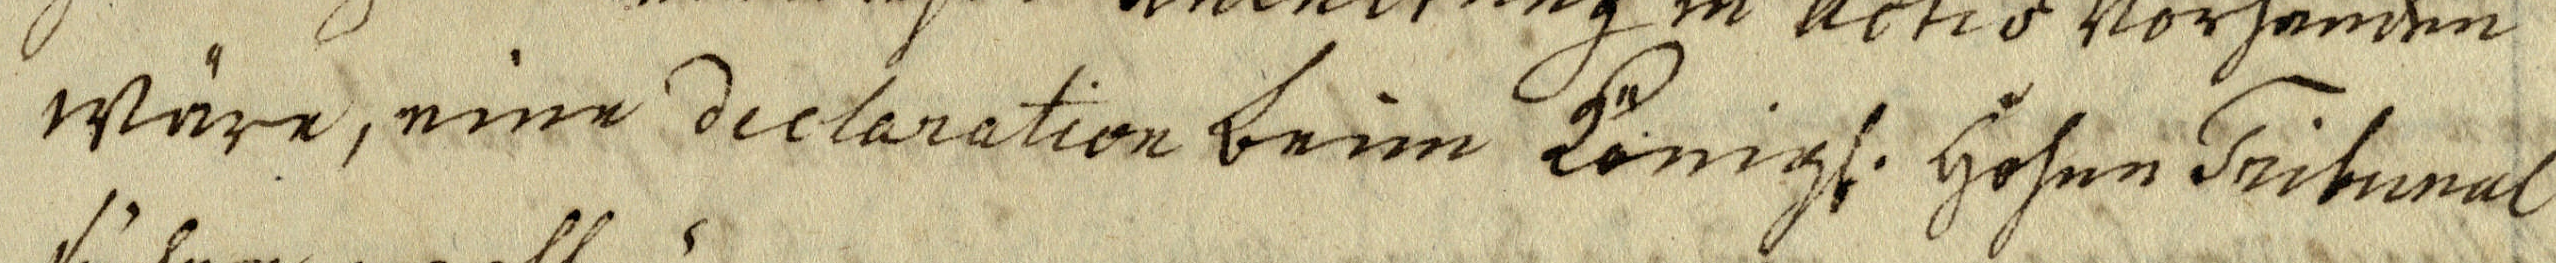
wäre, eine declaration beim Königl. Hohen Tribunal
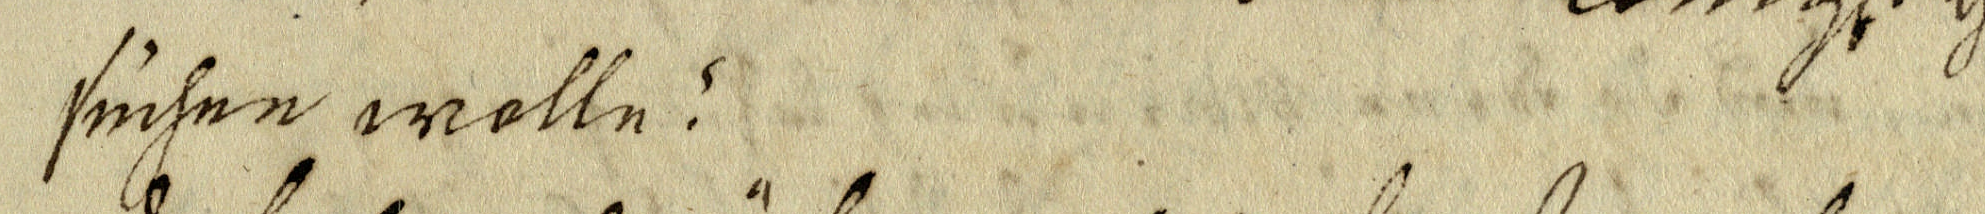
suchen wolle.
